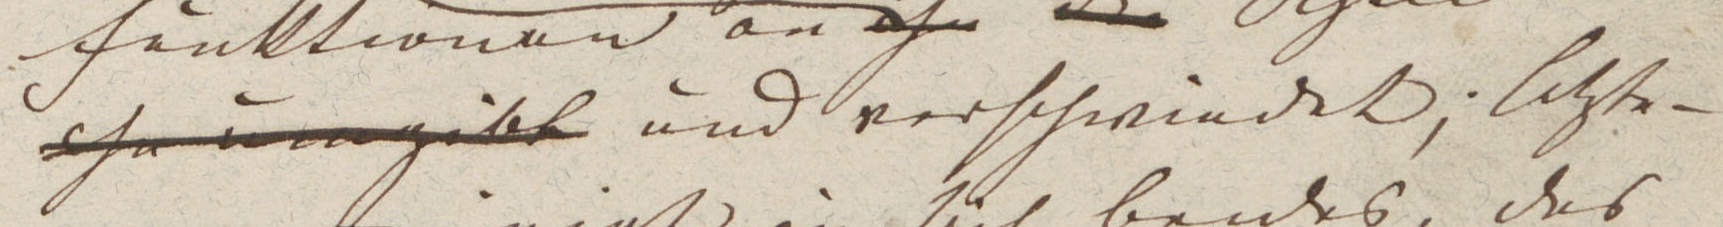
ihn umgibt und verschwindet; letzte-
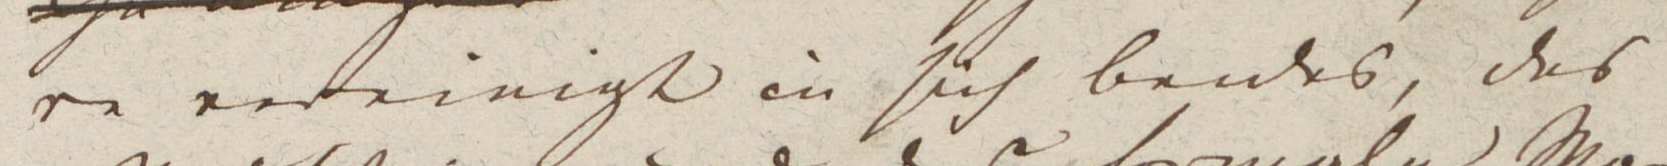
re vereinigt in sich beides, das
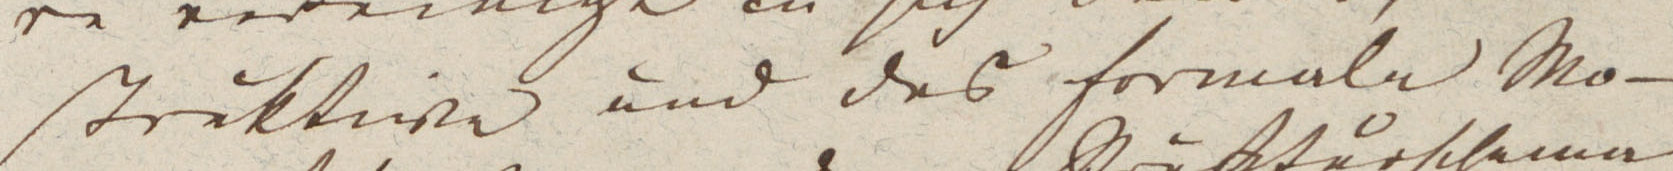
struktive und das formale Mo-
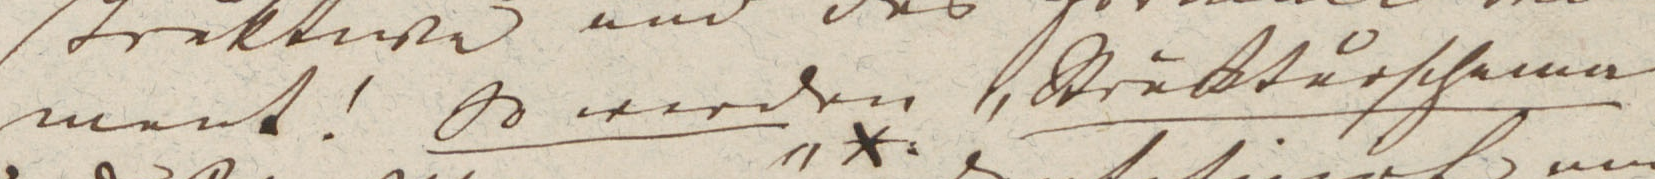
ment! So werden "Strukturschema"
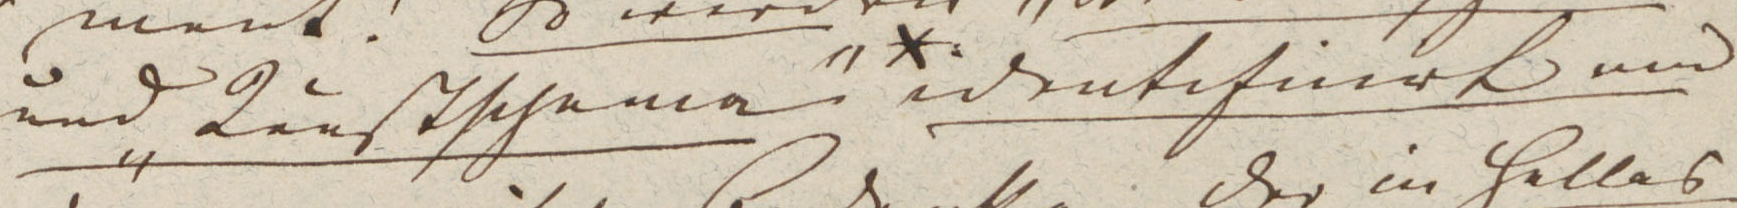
und "Kunstschema" % identificirt und
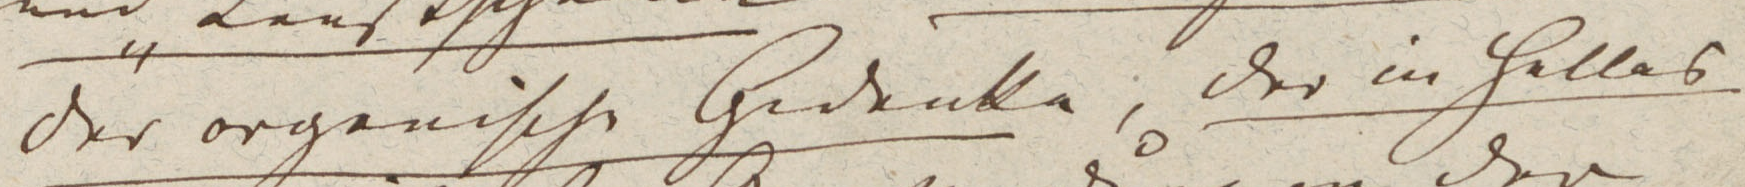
der organische Gedanke; der in Hellas
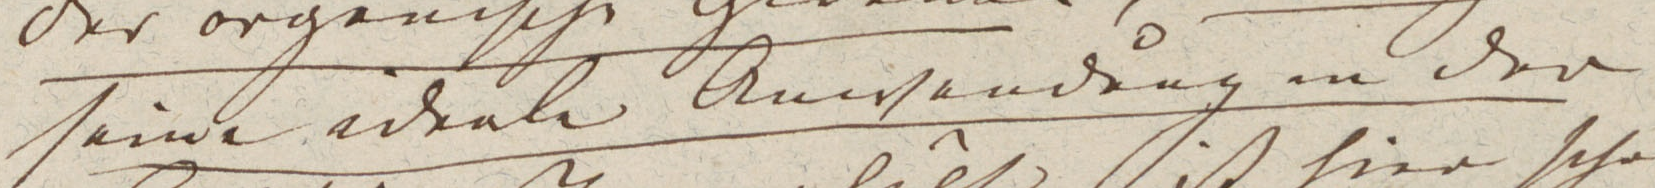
seine ideale Anwendung in der
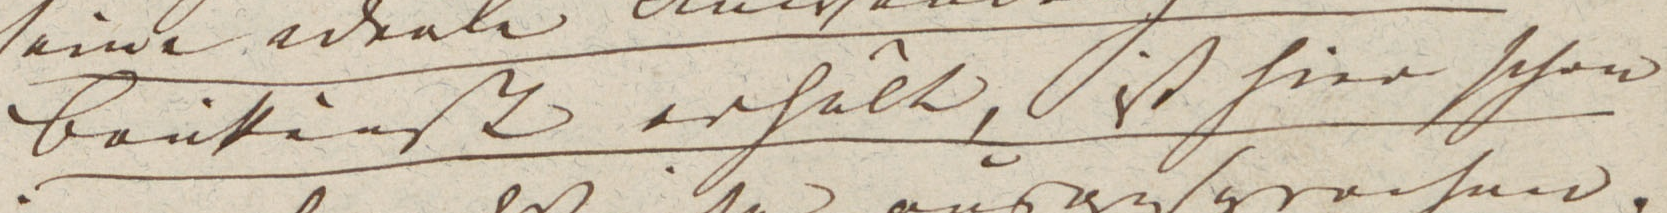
Baukunst erhält, ist hier schon
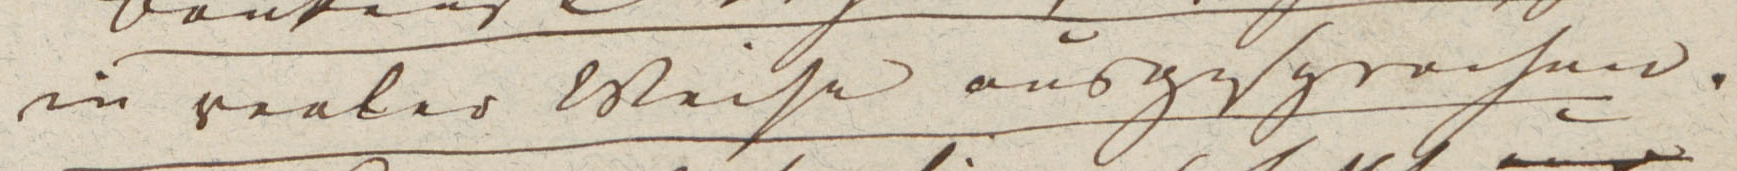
in realer Weise ausgesprochen.
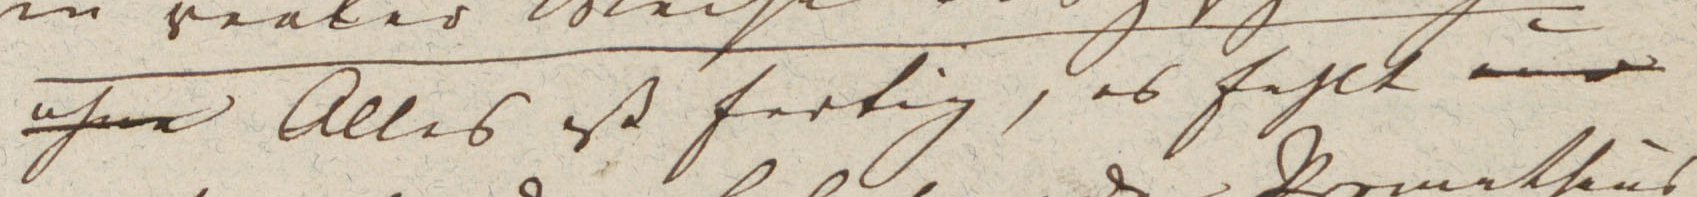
ohne Alles ist fertig, es fehlt nur
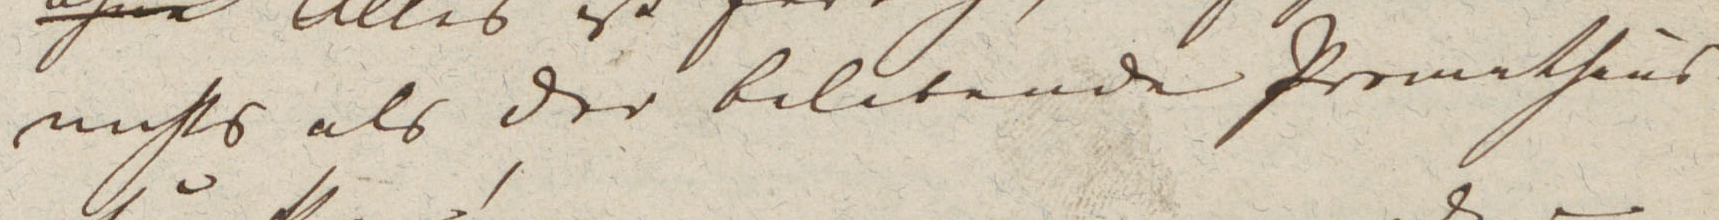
nichts als der belebende Prometheus-
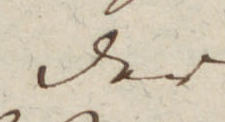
der
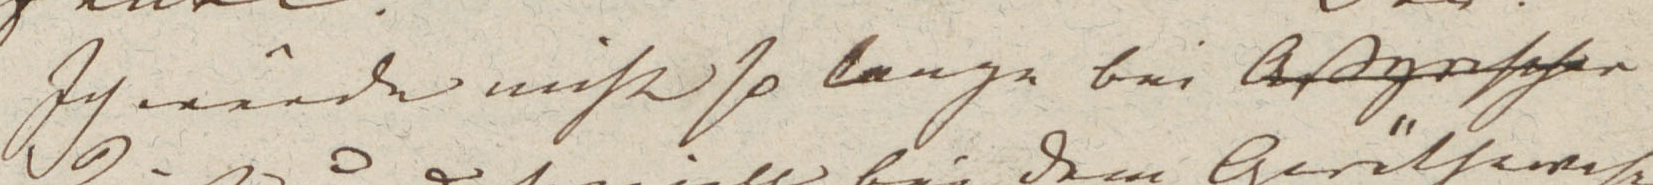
Ich würde nicht so lange bei Assyrischer
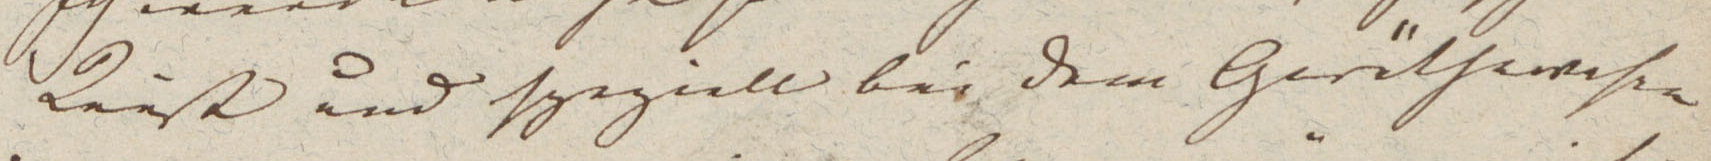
Kunst und speziell bei dem Geräthewesen
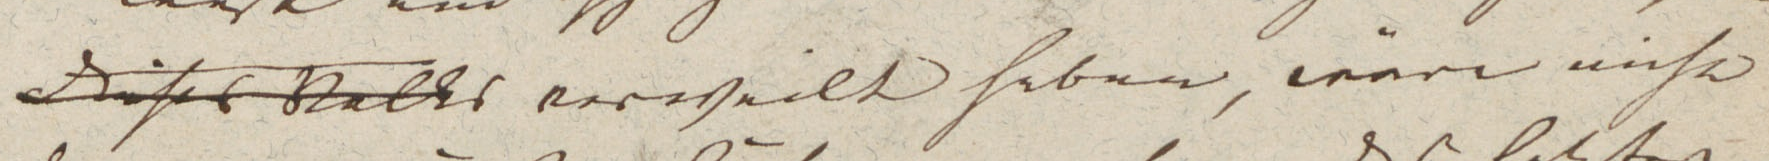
dieses Volks verweilt haben, wäre nicht
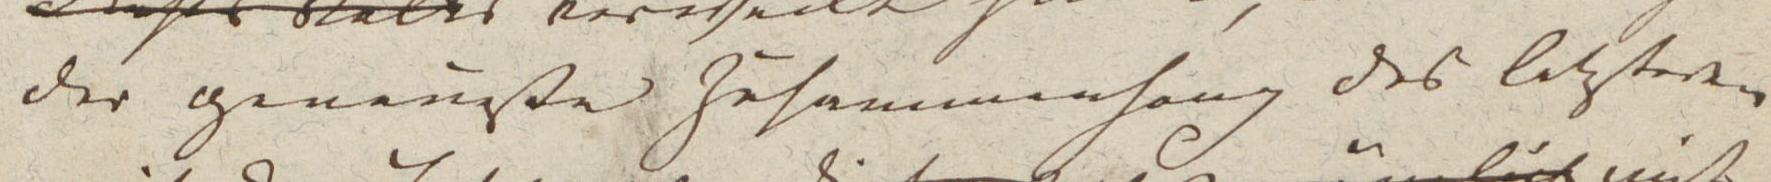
der genaueste Zusammenhang des letzteren
